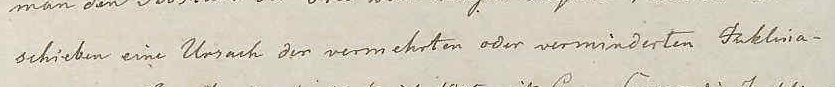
schieben eine Ursach der vermehrten oder verminderten Inklina-
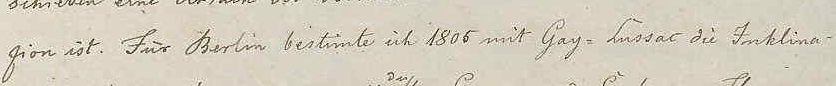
zion ist. Für Berlin bestimte ich 1805 mit Gay-Lussac die Inklina-
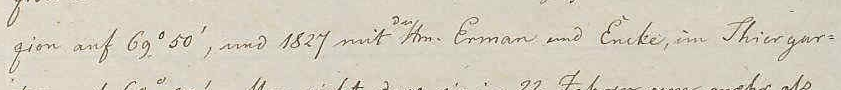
zion auf 69°50′, und 1827 mit den Hrn. Erman und Encke, im Thiergar-
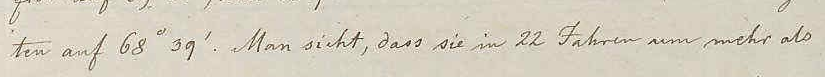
ten auf 68°39′. Man sieht, dass sie in 22 Jahren um mehr als
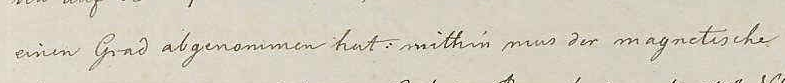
einen Grad abgenommen hat: mithin mus der magnetische
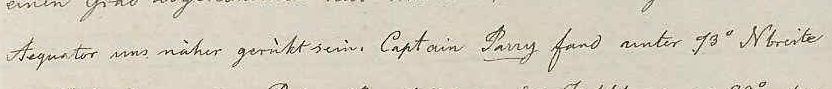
Aequator uns näher gerükt sein. Captain Parry fand unter 73° Nbreite
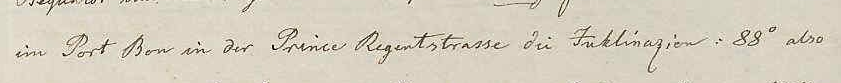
im Port Bon in der Prince Regentstrasse die Inklinazion: 88° also
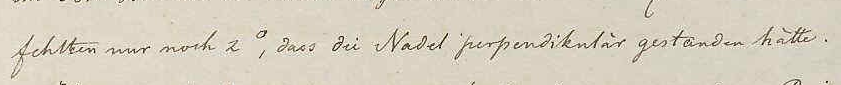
fehlten nur noch 2°, dass sie Nadel perpendikulär gestanden hätte.
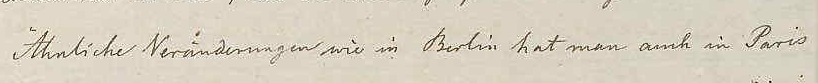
Ähnliche Veränderungen wie in Berlin hat man auch in Paris
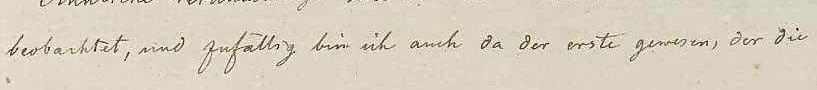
beobachtet, und zufällig bin ich auch da der erste gewesen, der die
